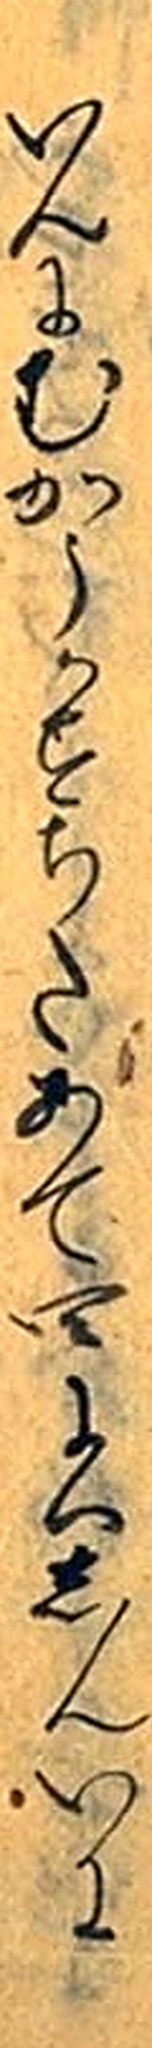いんにむかうかすちたあて四にはしんいに
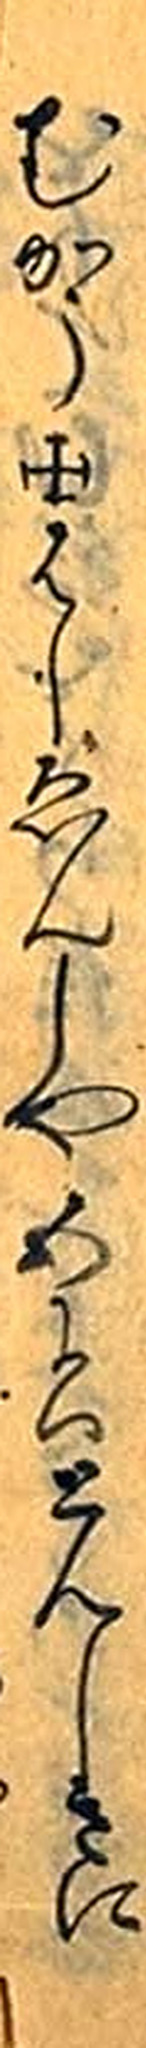むかう☩はしゑんしや五にはとんしきに
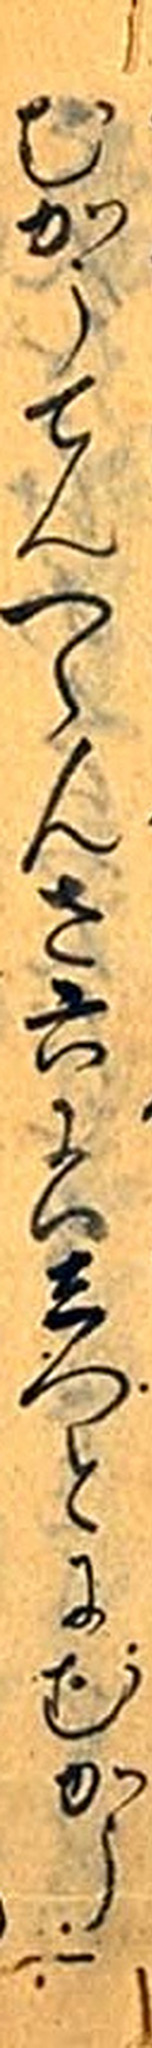むかうてんへらんさ六にはしつとにむかう
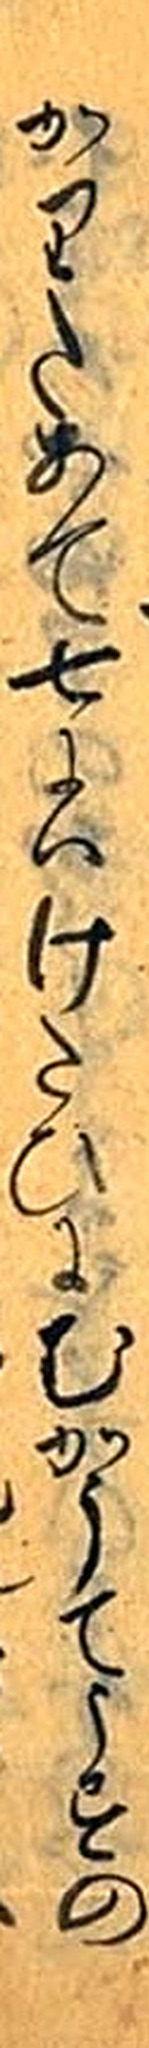かりたあて七にはけたひにむかうてうすの
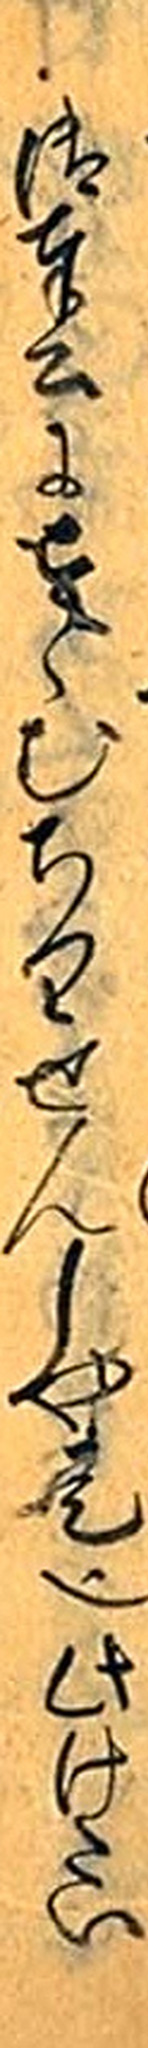御奉公にすゝむちりせんしや是也此けたい
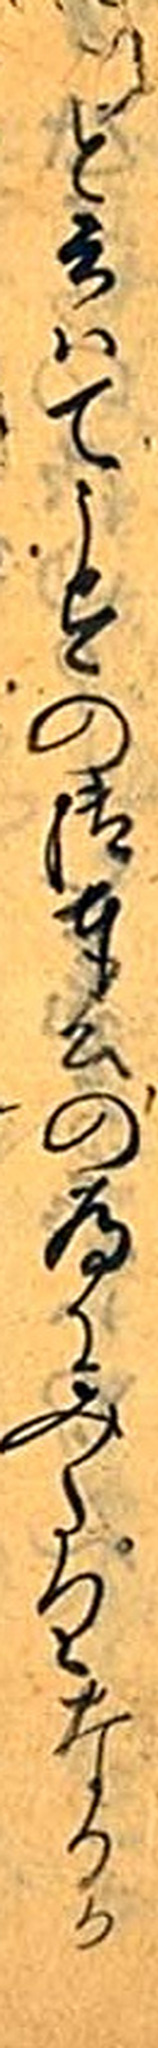と云はてうすの御奉公の為にみたりなるか
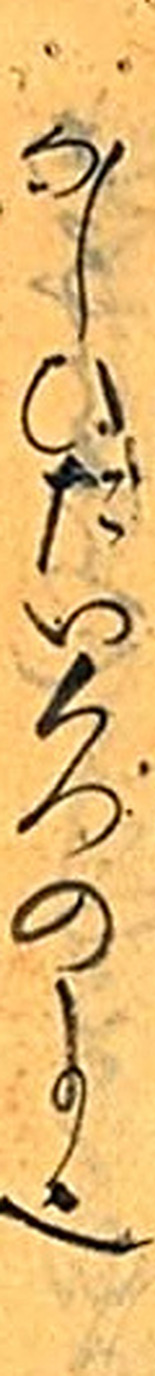なしひたいくつの事也
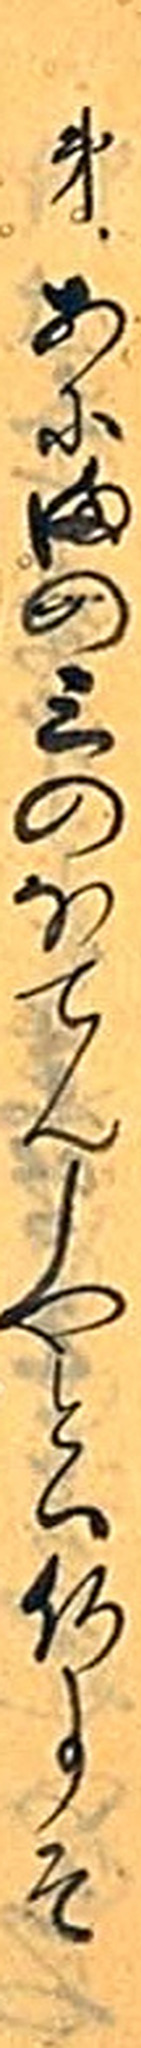弟あにまの三のほてんしやとは何事そ
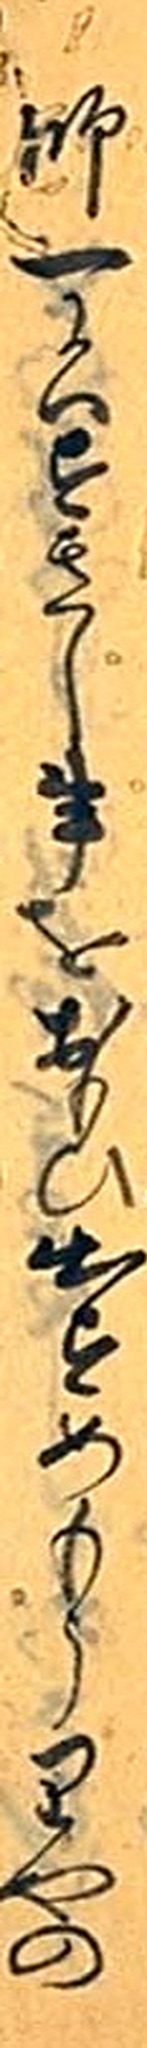師一にはすきし事をおもひ出すめもうりやの
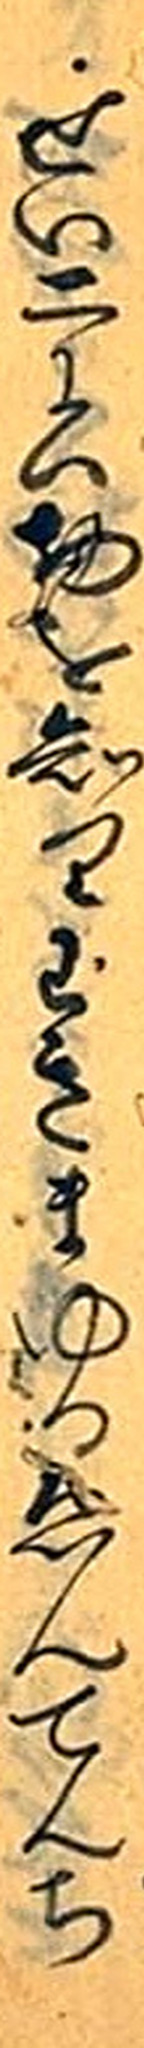せい二には物を知りわきまゆるゑんてんち
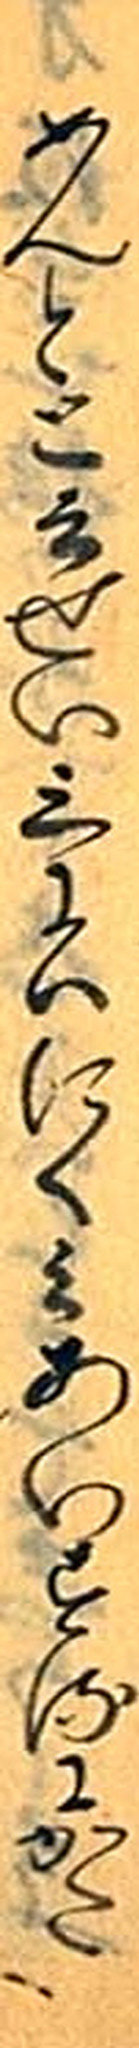めんとと云せい三にはにくみあいするにかた
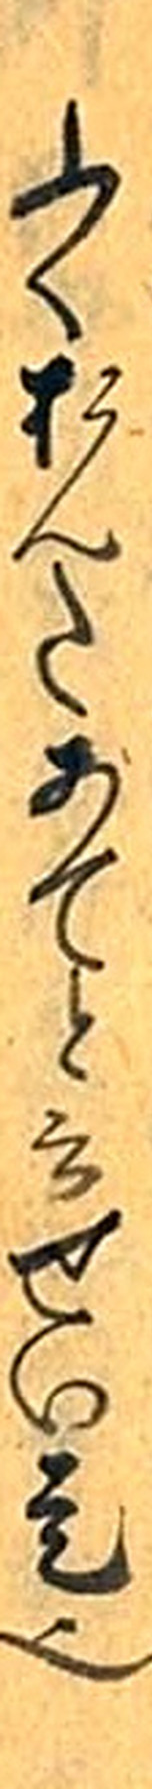ふくおんたあてと云せい是也
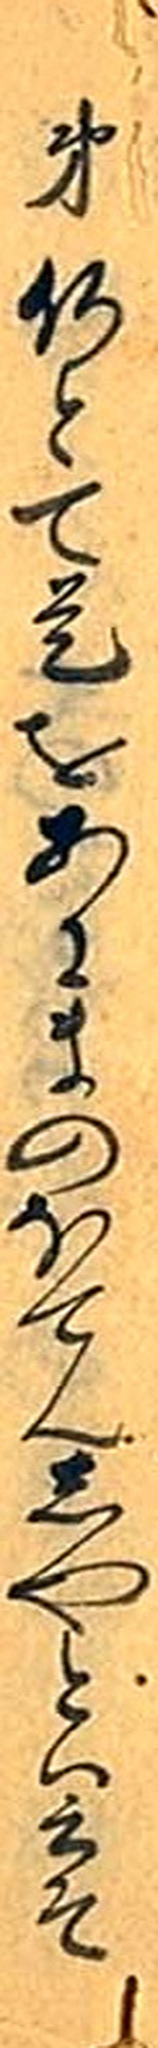弟何とて是をあにまのほてんしやとは云そ
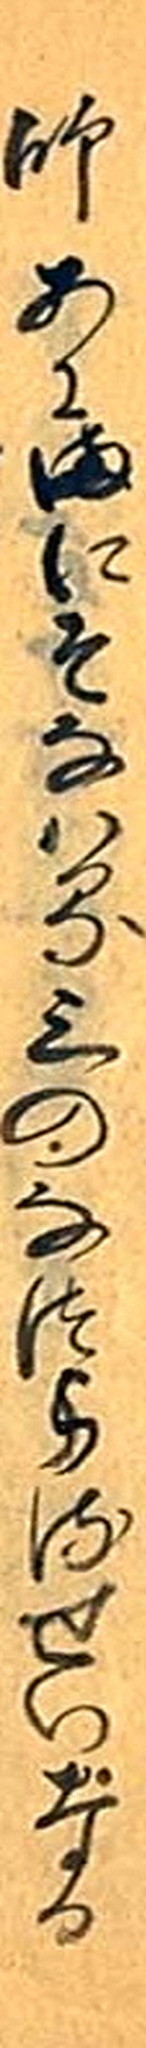師あにまにそなはる三のなつらるせいなる
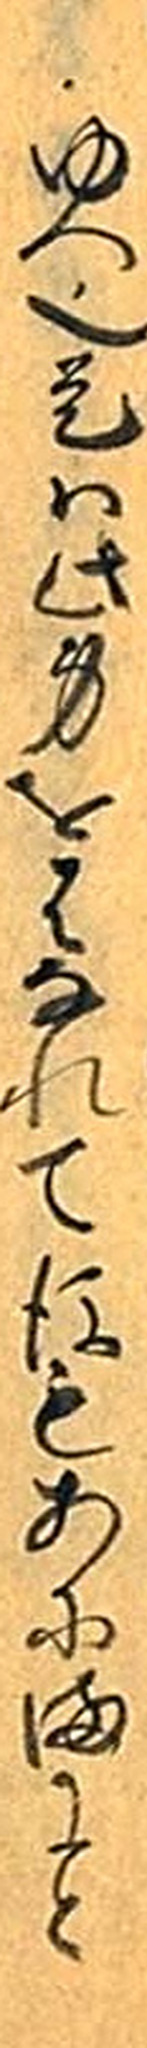ゆへ也是は此身をはなれて後もあにまにと
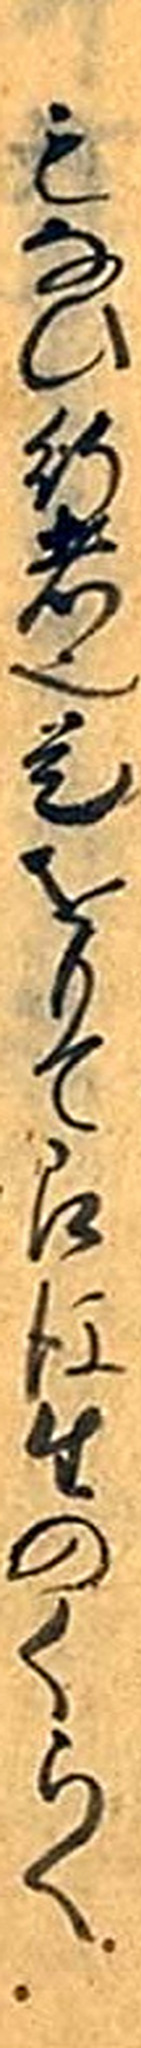もなひ行者也是をもて即後生のくらく
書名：ドチリナ・キリシタン
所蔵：東京大学総合図書館 / General Library in the University of Tokyo
